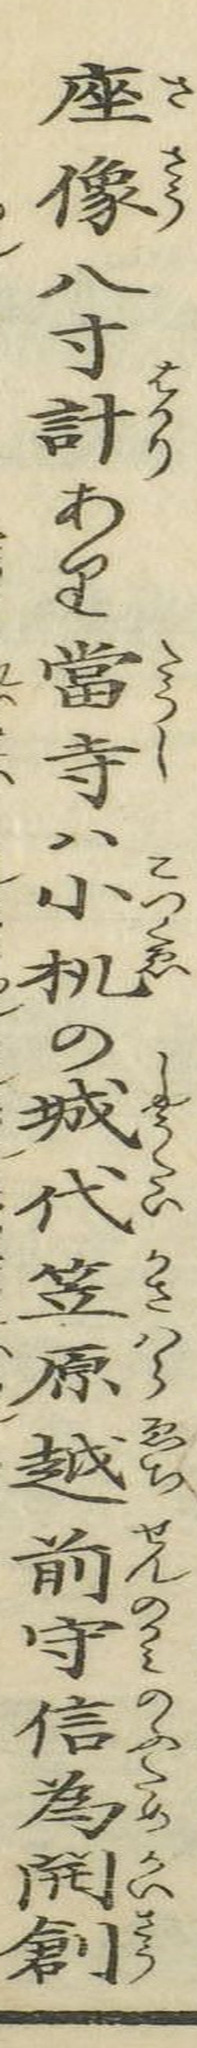座像八寸計あり當寺は小机の城代笠原越前守信為開創
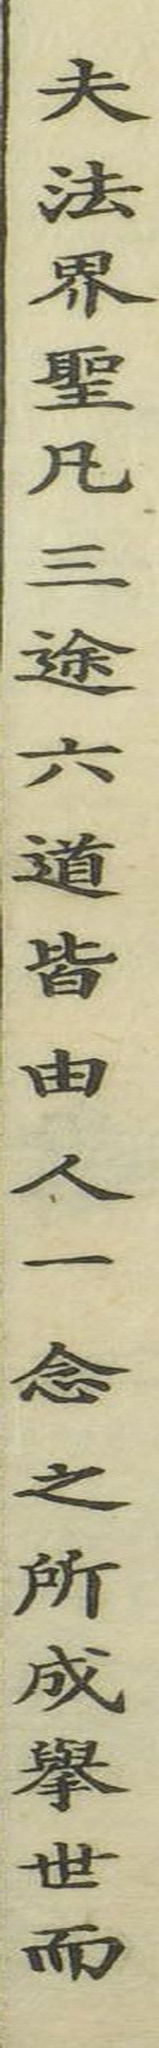夫法界聖凡三途六道皆由人一念之所成擧世而

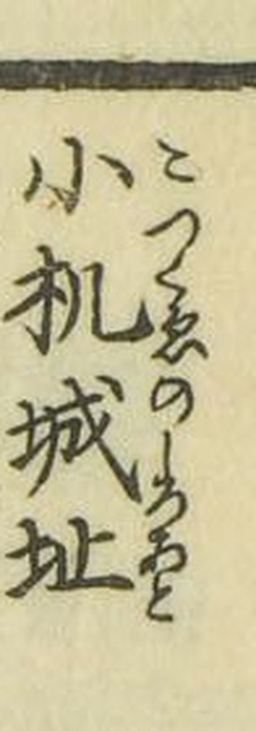小机城址
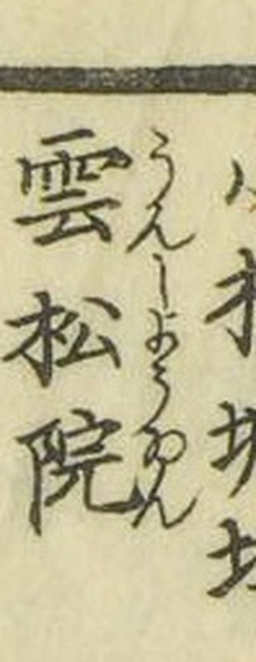雲松院
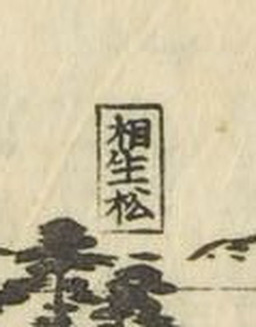相生松

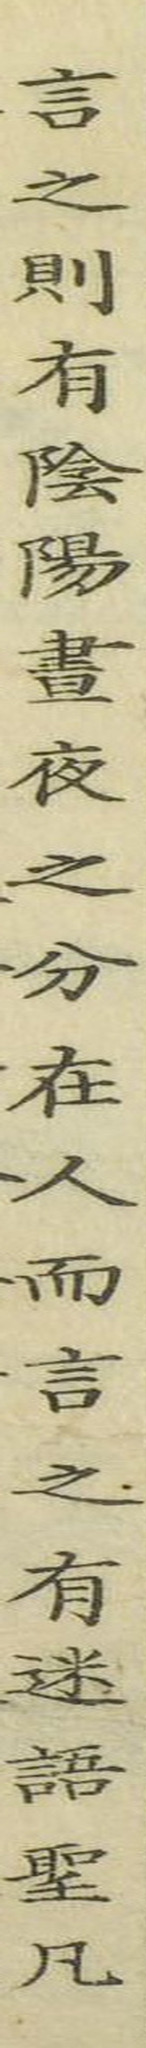言之則有陰陽晝夜之分在人而言之有迷語聖凡
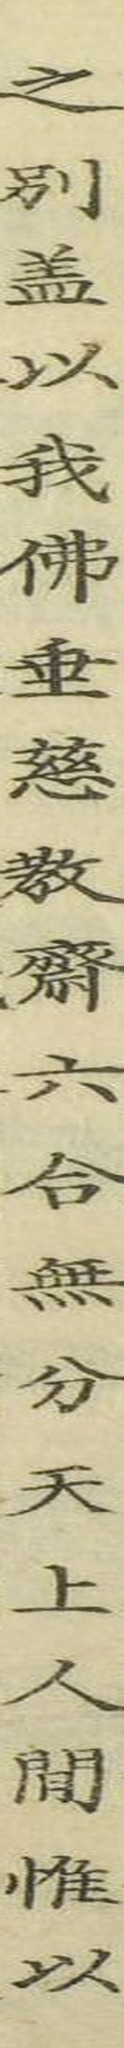之別盖以我佛垂慈教齋六合無分天上人閒惟以
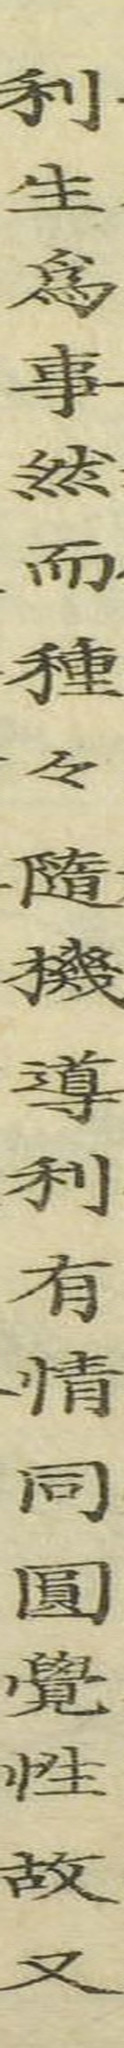利生爲事然而種々隨機導利有情同圓覺性故又
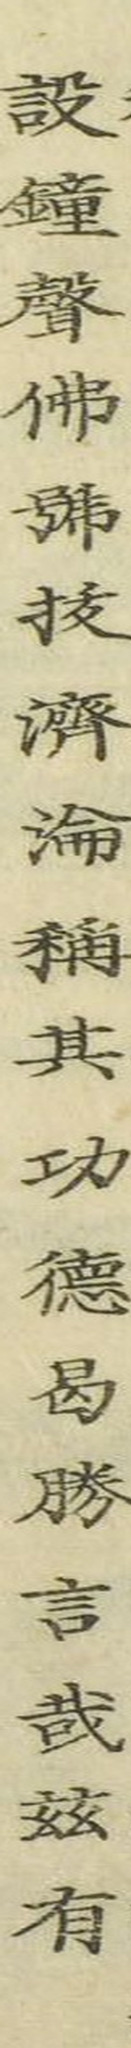設鐘聲佛號拔濟淪稱其功德曷勝言哉茲有
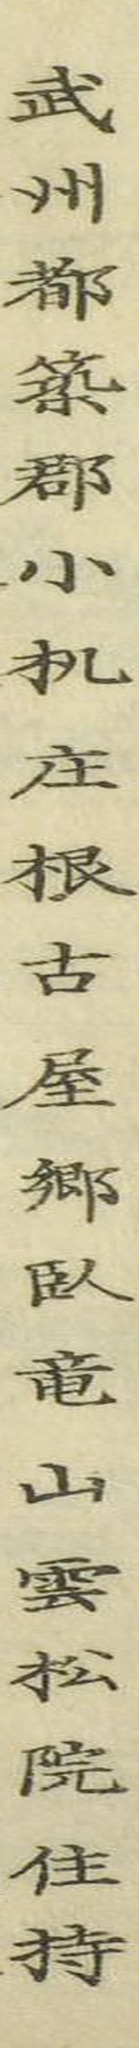武州都築郡小机庄根古屋郷臥竜山雲松院住持
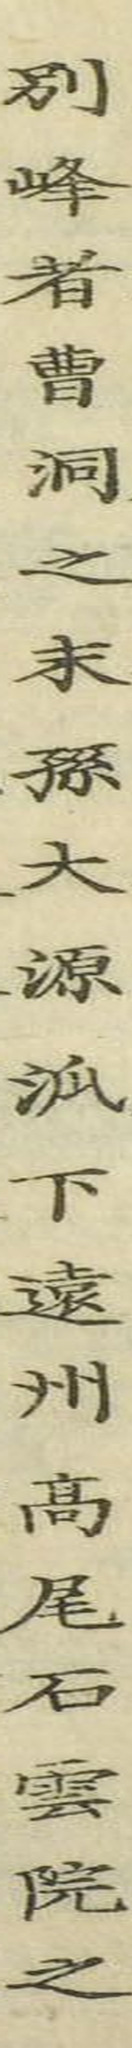別峰者曹洞之末孫大源派下遠州高尾石雲院之
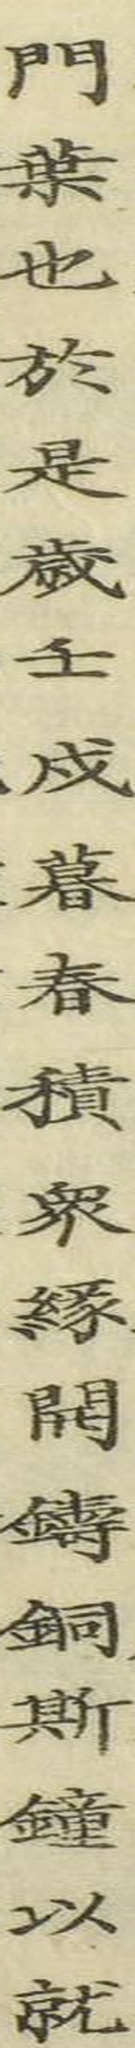門葉也於是歳壬戌暮春積衆掾開鑄銅斯鐘以就
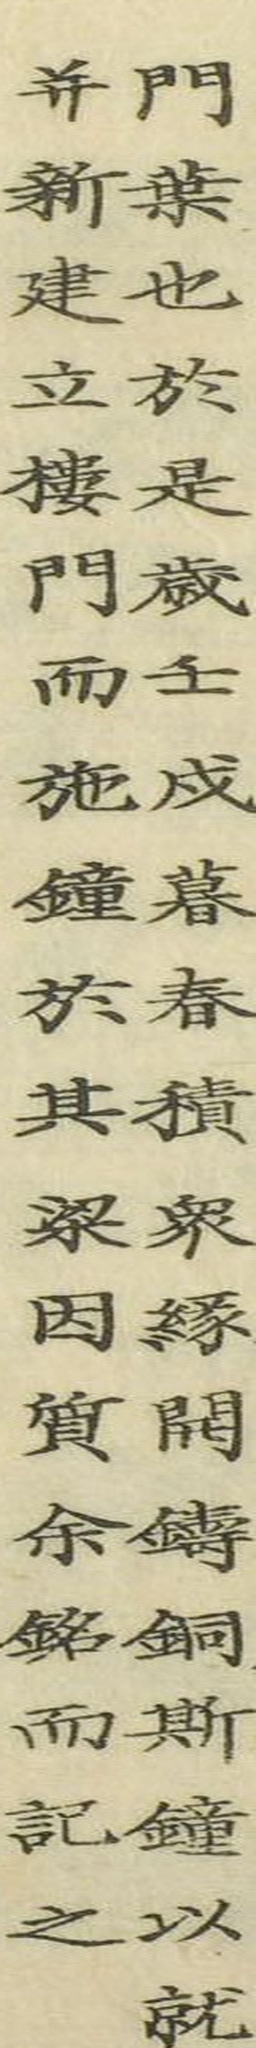并新建立樓門而施鐘於其梁因質余銘而記之
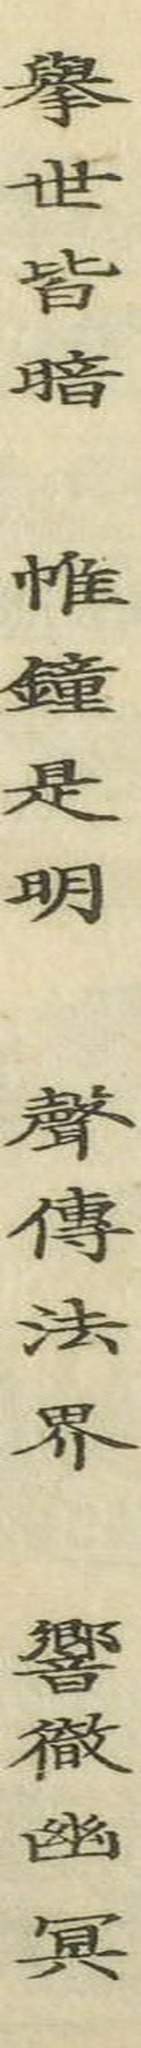擧世皆暗帷鐘是明聲傳法界響徹幽冥
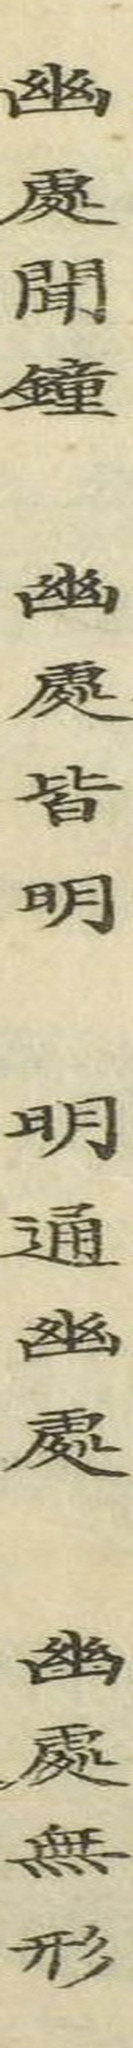幽處聞鐘幽處皆明明通幽處幽處無形
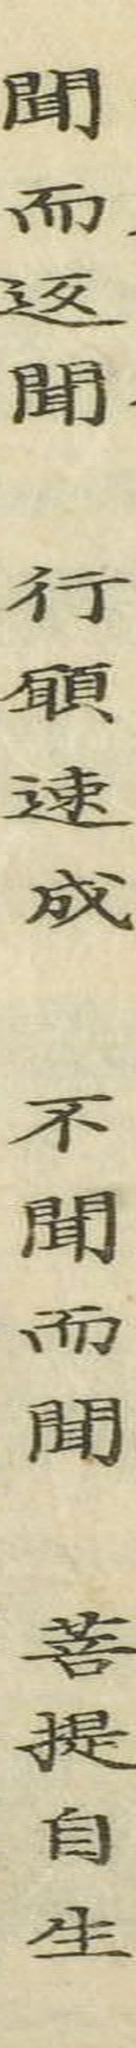聞而返聞行顧速成不聞而聞菩提自生
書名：江戸名所図会 20巻 巻之5
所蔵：東京学芸大学教育コンテンツアーカイブ
